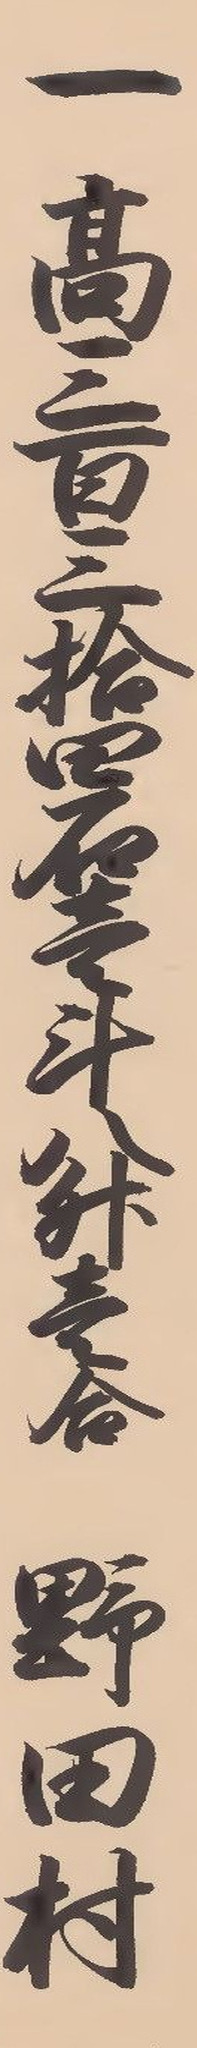一高三百三拾四石壱斗八升壱合野田村
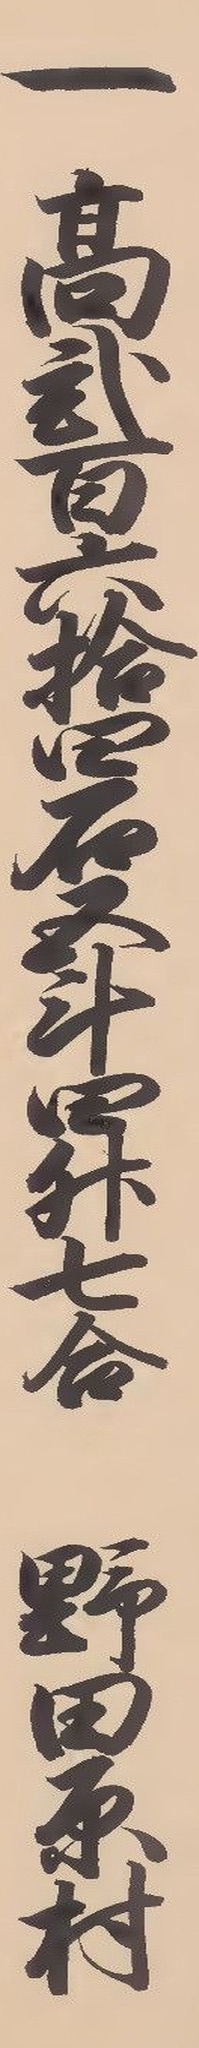一高弐百六拾四石五斗四升七合野田原村
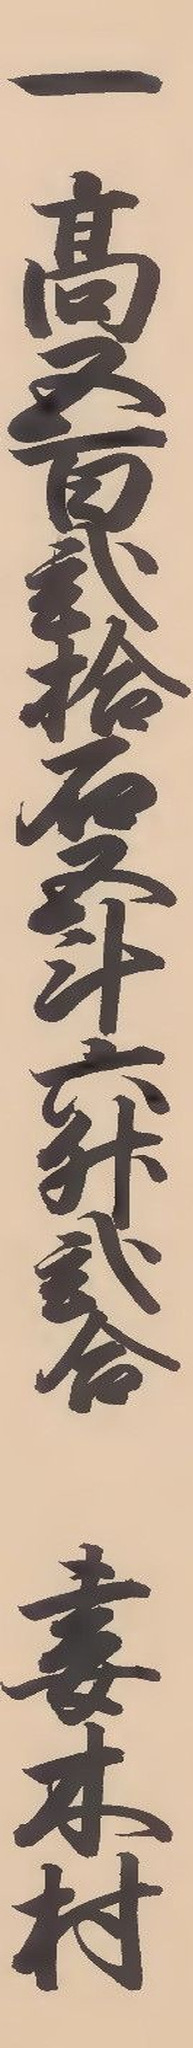一高五百弐拾石五斗六升弐合妻木村
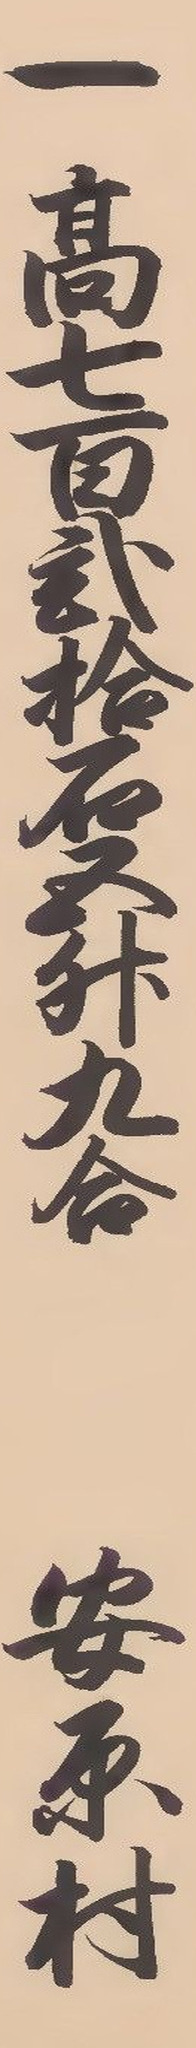一高七百弐拾石五升九合安原村

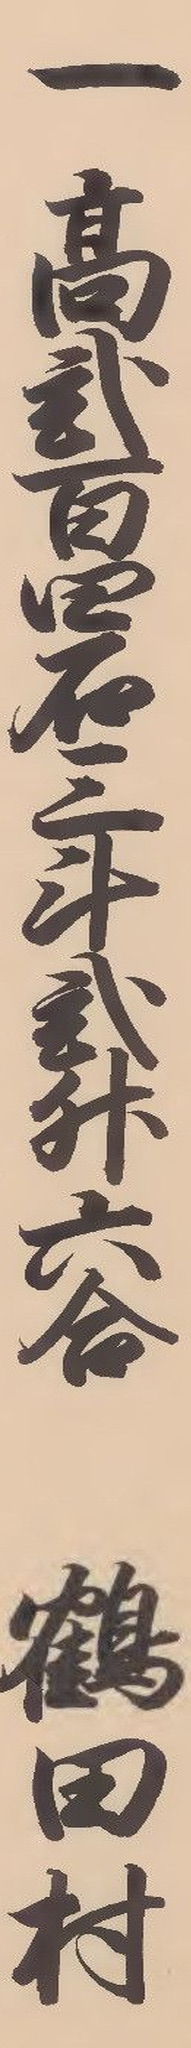一高弐百四石三斗弐升六合鶴田村
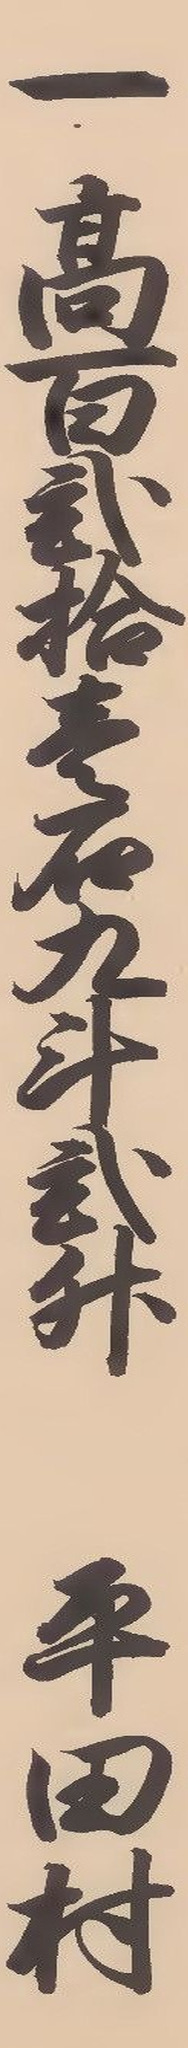一高百弐拾壱石九斗弐升平田村
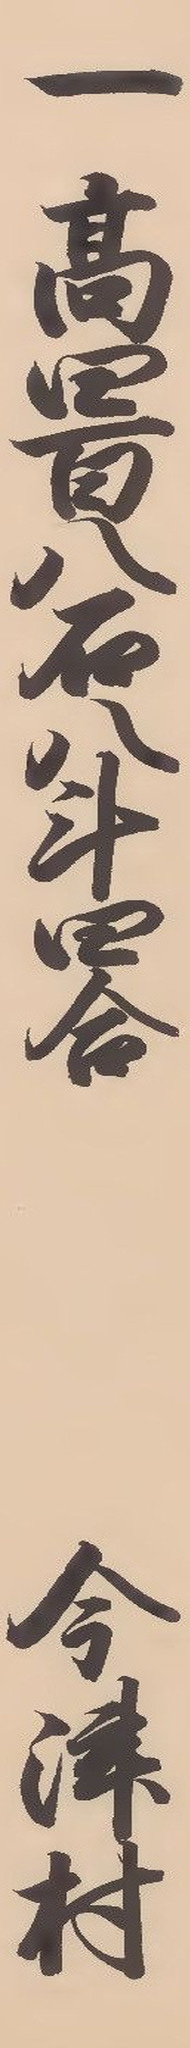一高四百八石八斗四合今津村
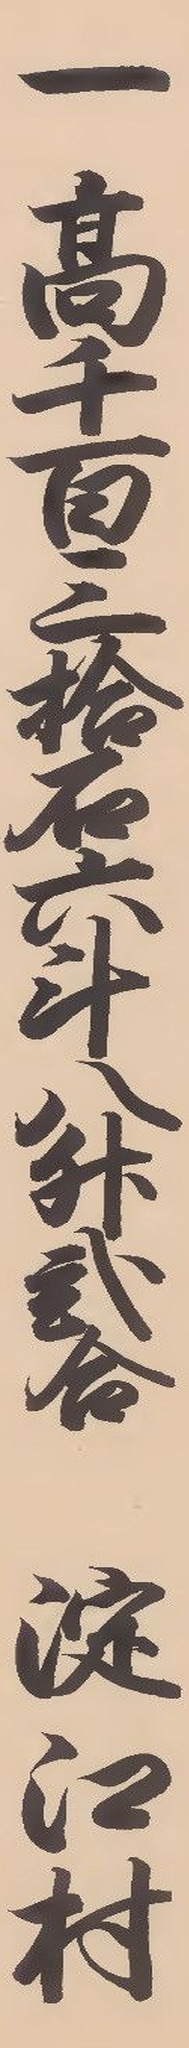一高千百三拾石六斗八升弐合淀江村
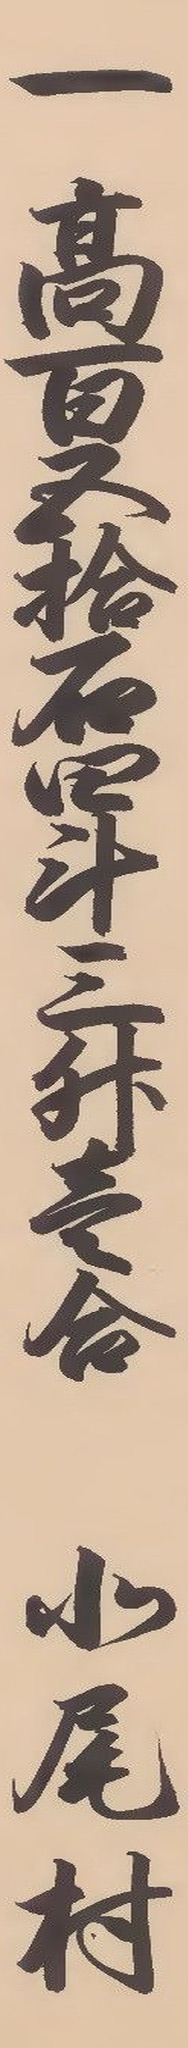一高百五拾石四斗三升壱合北尾村
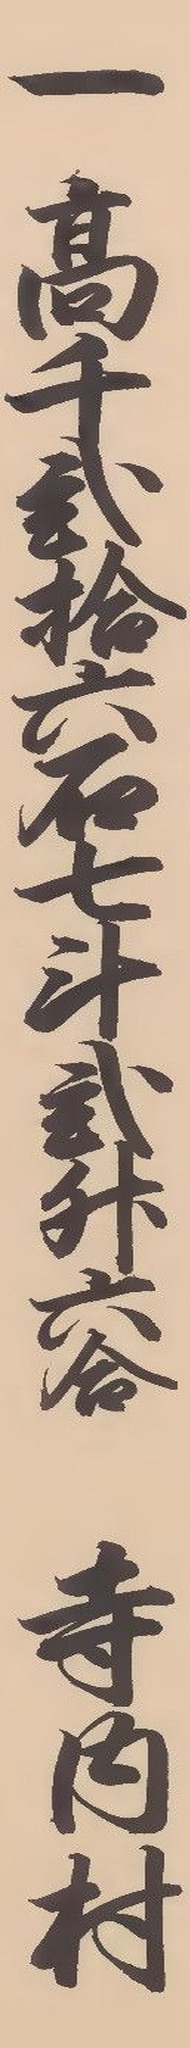一高千弐拾六石七斗弐升六合寺内村
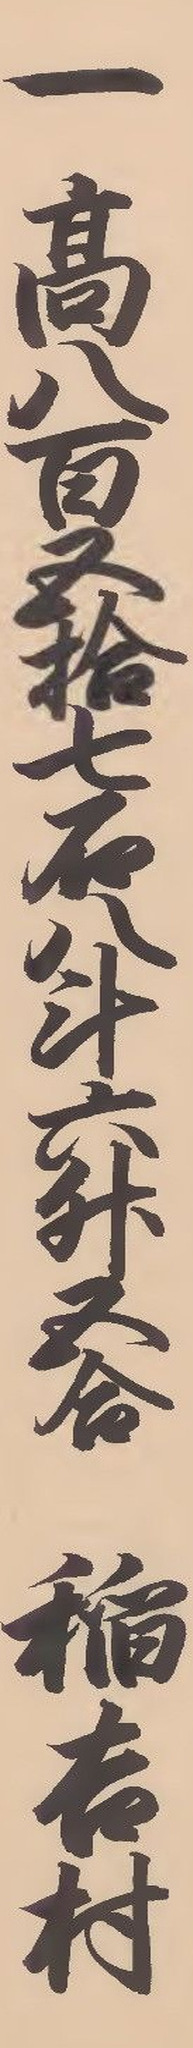一高八百五拾七石八斗六升五合稲吉村

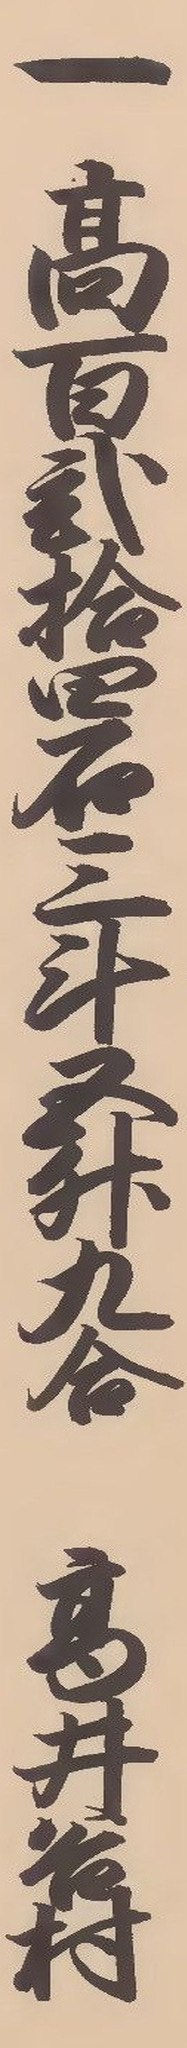一高百弐拾四石三斗五升九合高井谷村
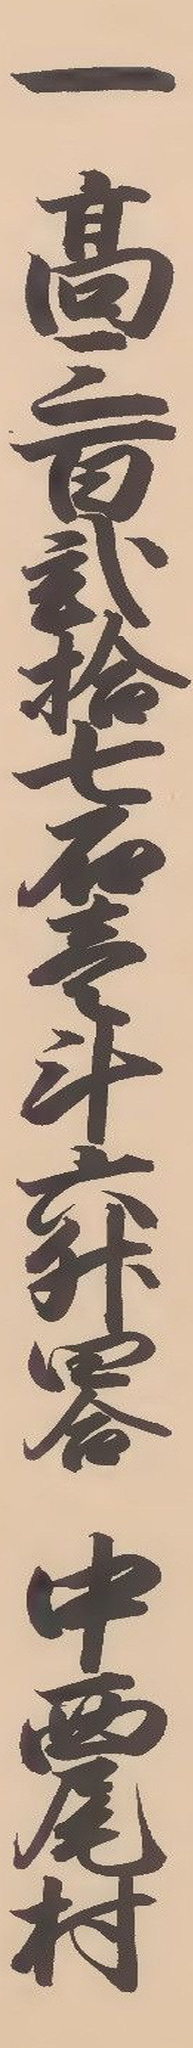一高三百弐拾七石壱斗六升四合中西尾村
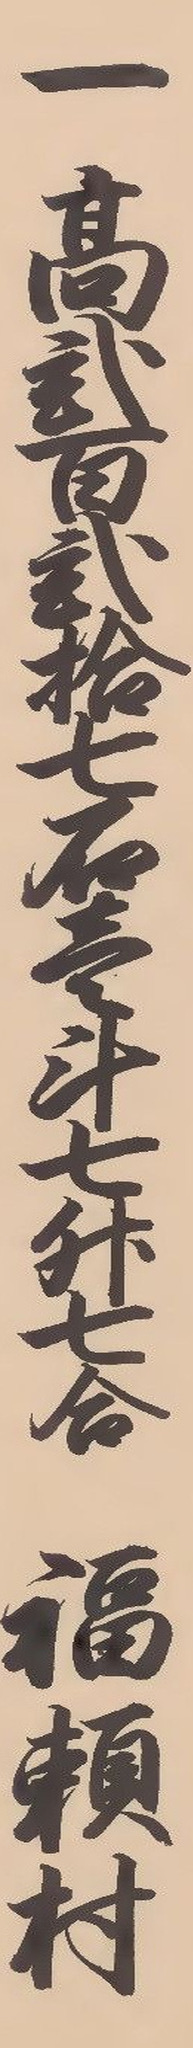一高弐百弐拾七石壱斗七升七合福頼村
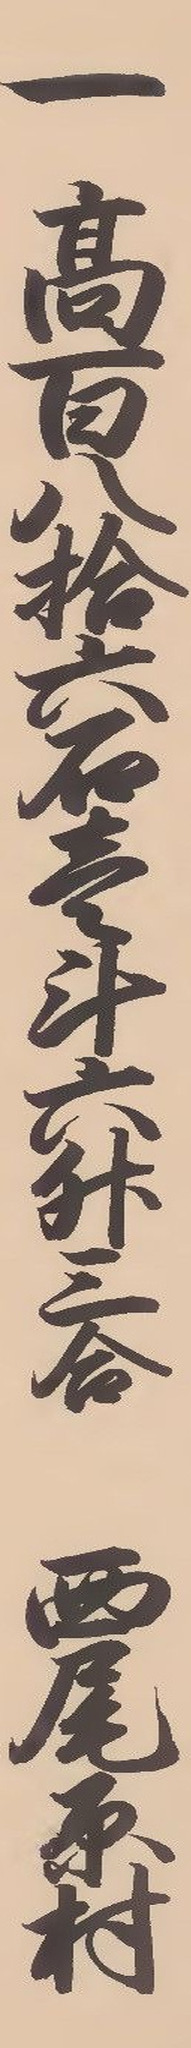一高百八拾六石壱斗六升三合西尾原村
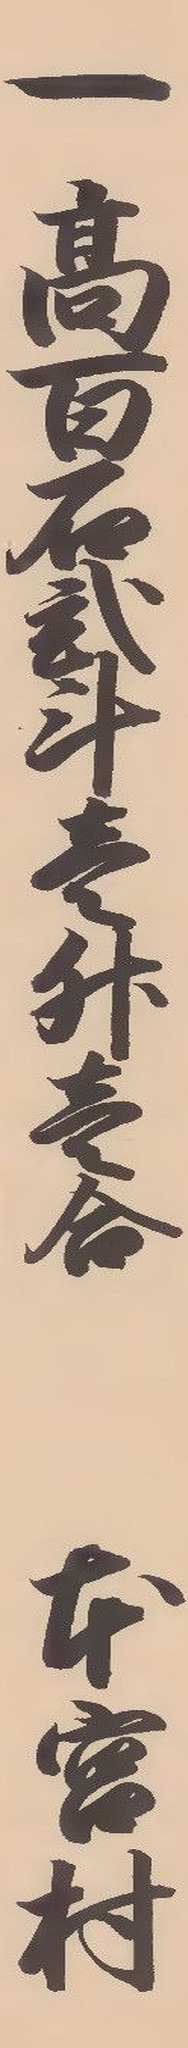一高百石弐斗壱升壱合本宮村
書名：伯耆国郷帳
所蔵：国立公文書館 National Archives of Japan
